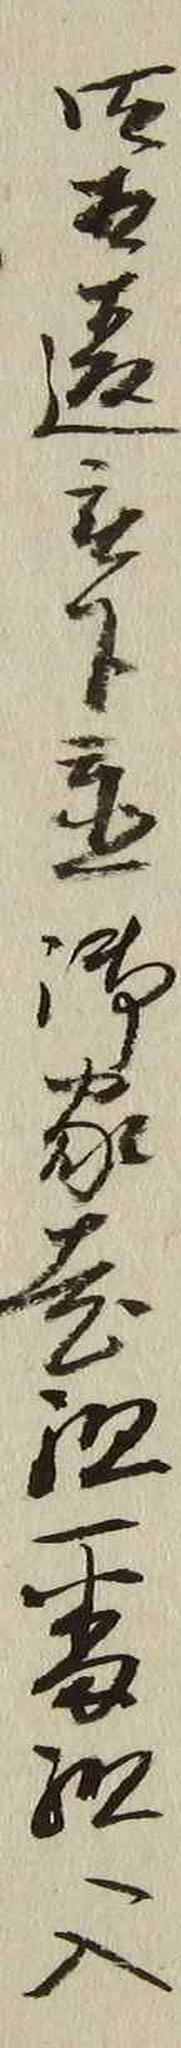御相違被下置御家老組一番組へ入
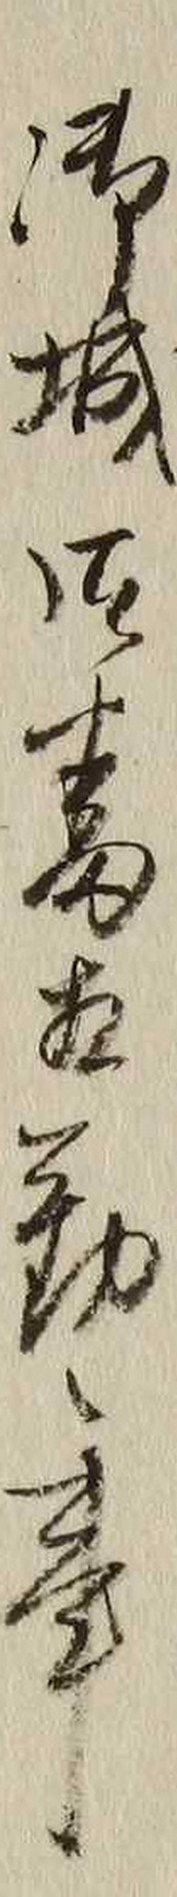御城御番相勤候事
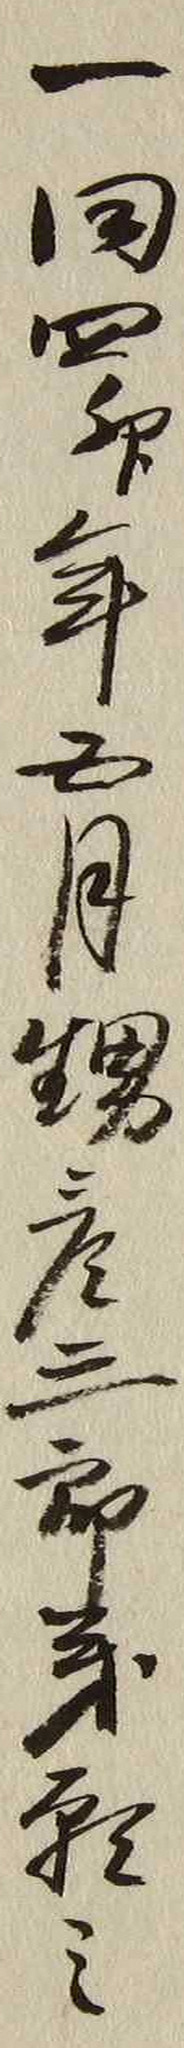一同四卯年五月甥彦三郎儀願之
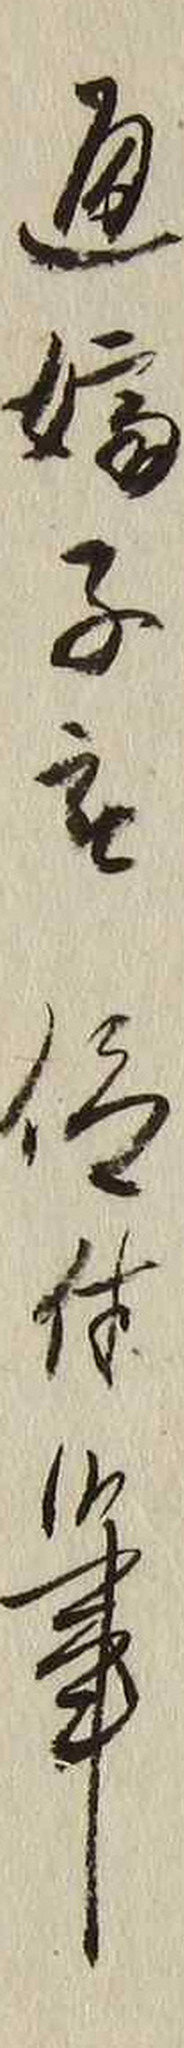通嫡子被仰付候事
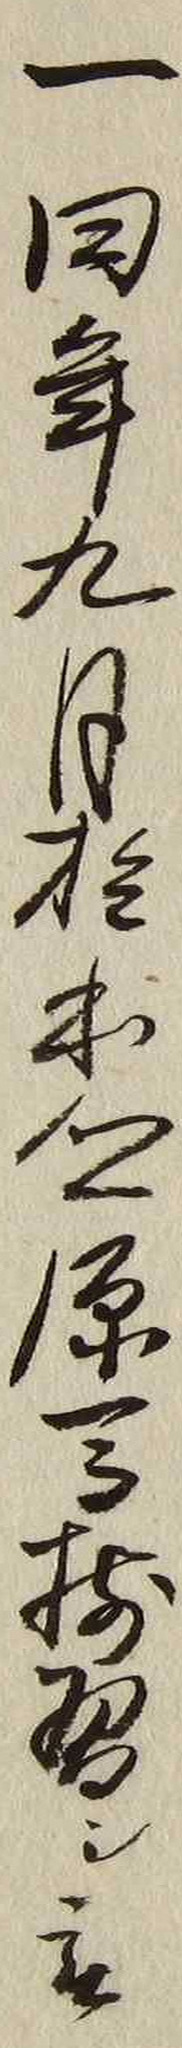一同年九月於本郷原馬揃習シ被
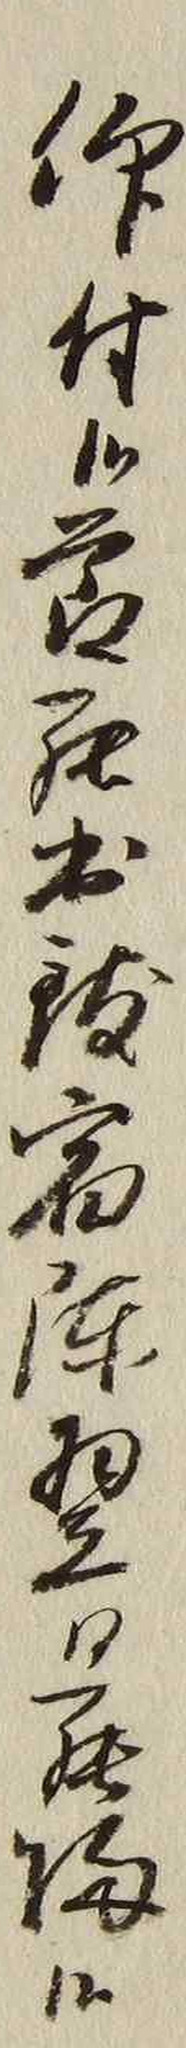仰付候節罷出致宿陣翌日罷帰候
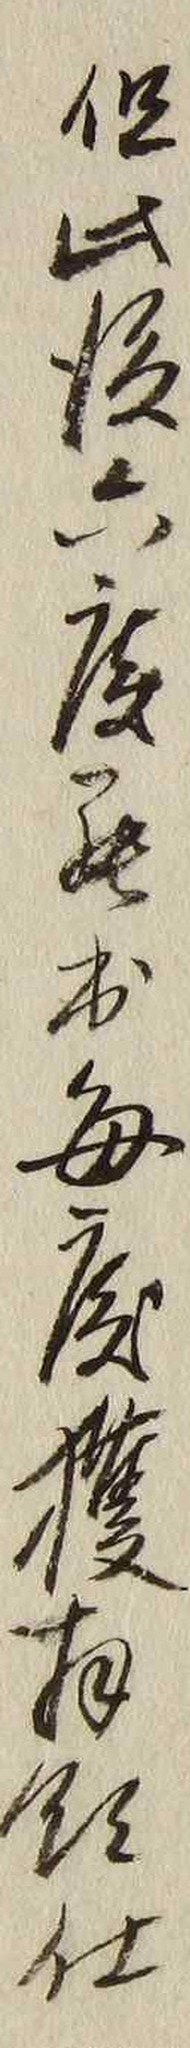但此後六度罷出毎度獲拝領仕
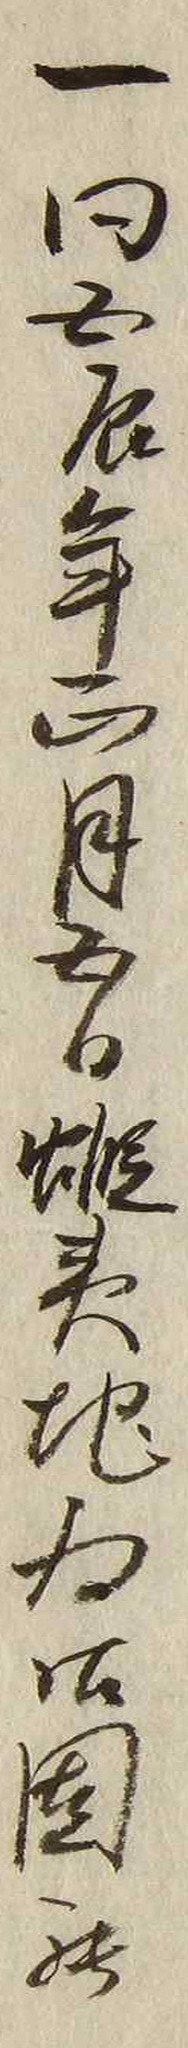一同五辰年正月五日蝦夷地為御固罷

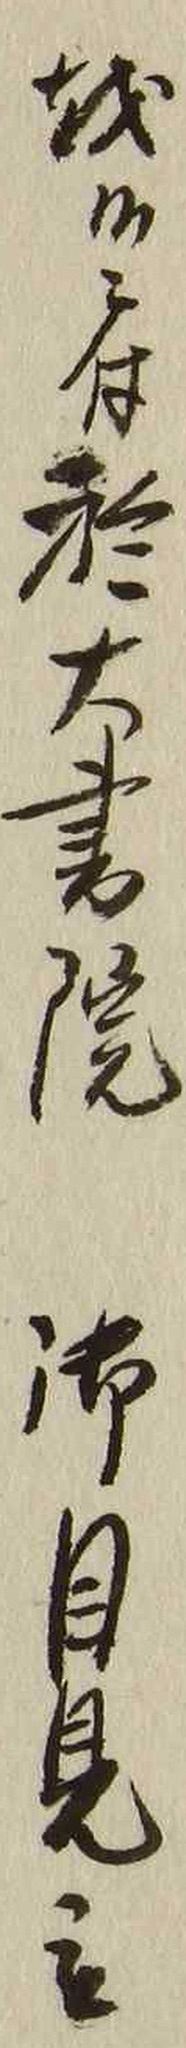越候ニ付於大書院御目見被
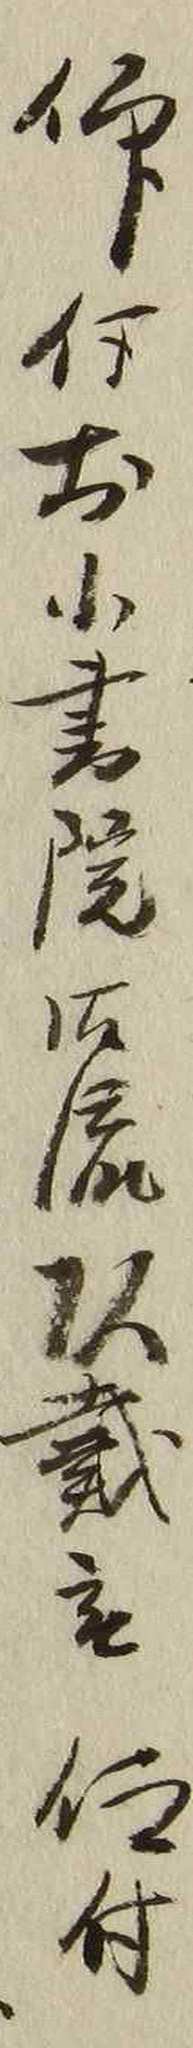仰付於小書院御流頂戴被仰付
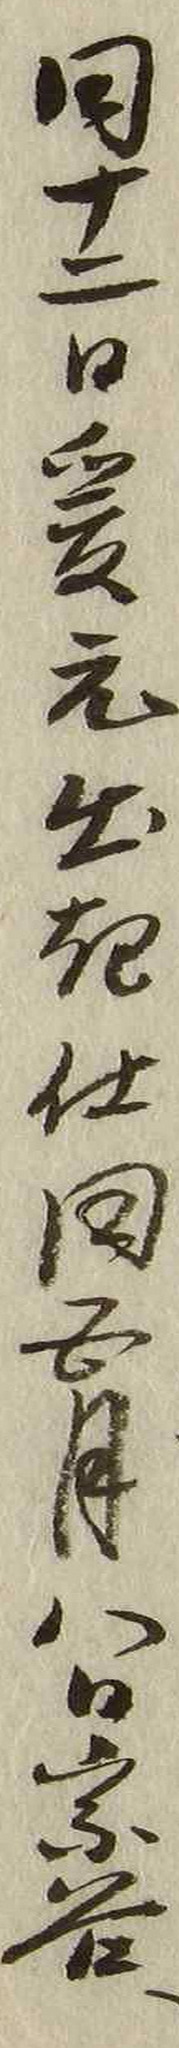同十二日爰元出起仕同五月八日宗谷へ
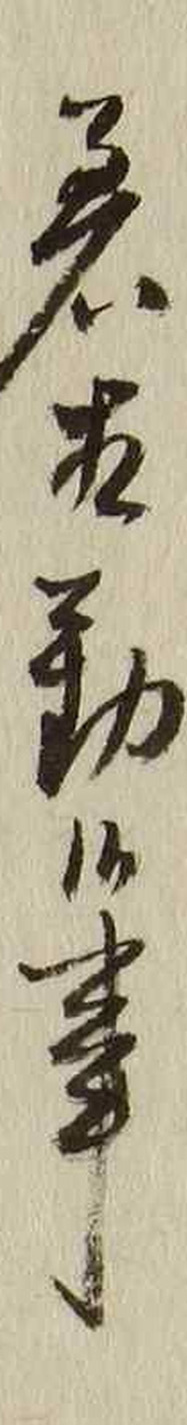着相勤候事
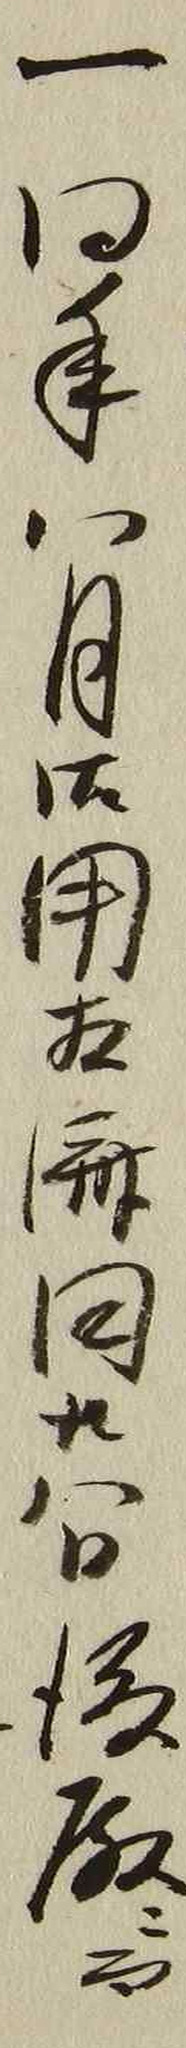一同年八月御用相済同廿八日後殿ニ而
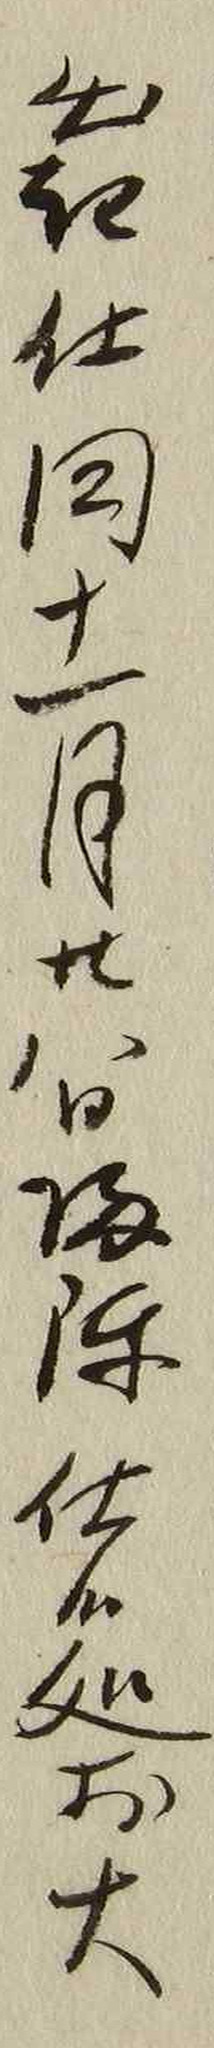出起仕同十一月廿八日帰陣仕候処於大
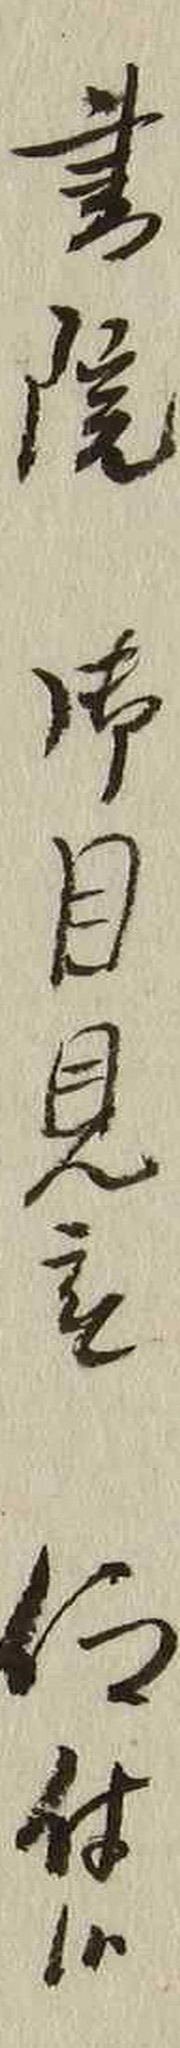書院御目見被仰付候
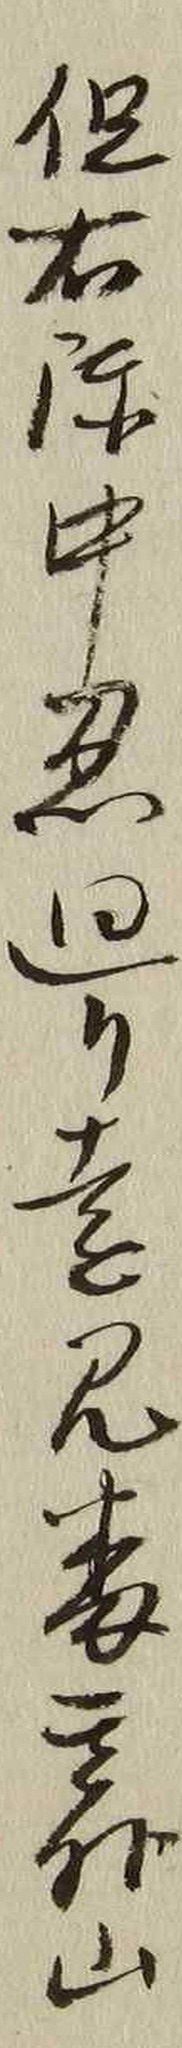但右陣中忍廻り遠見番其外山
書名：諸士系譜　巻之356　す之部6
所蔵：会津若松市立会津図書館
